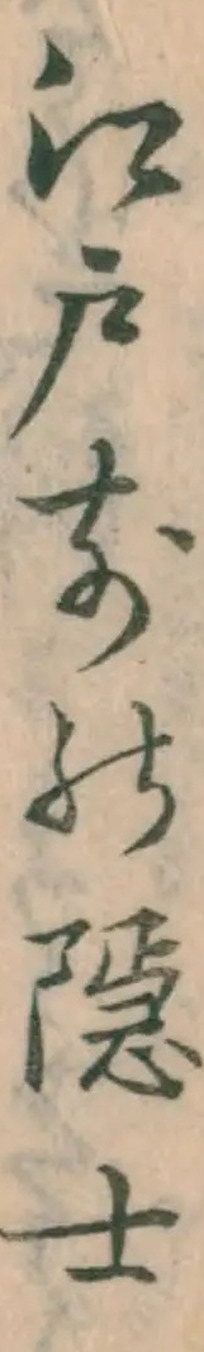江戸前の隠士
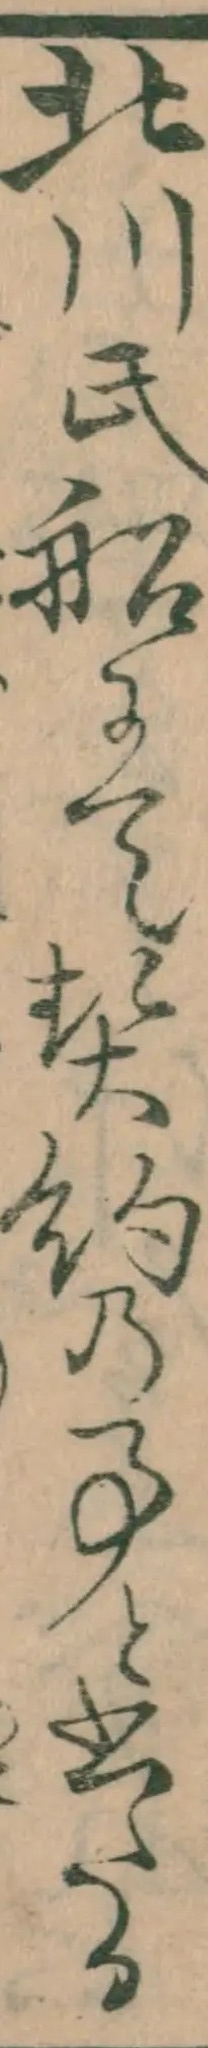北川氏船にて契約の事と書たる
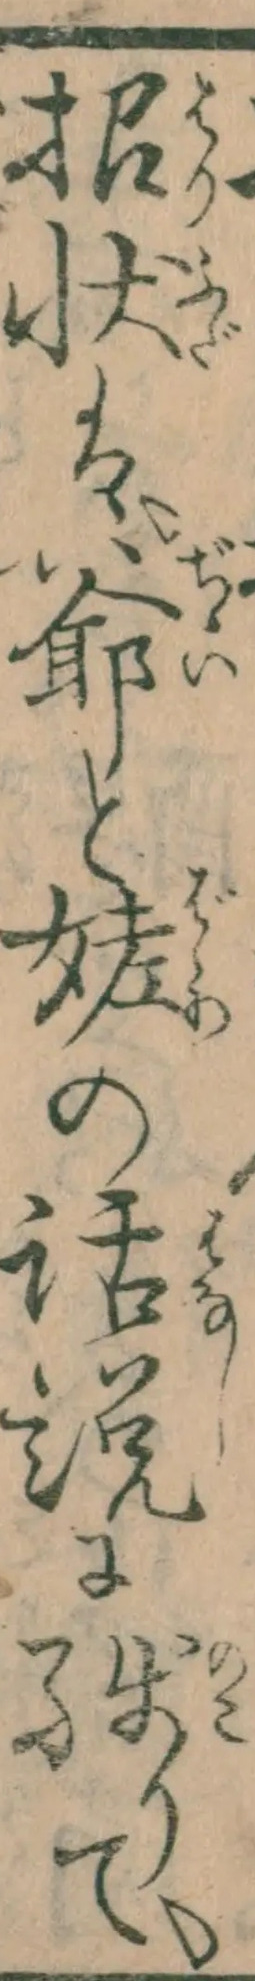招状は、爺と姥の話説に残りて、
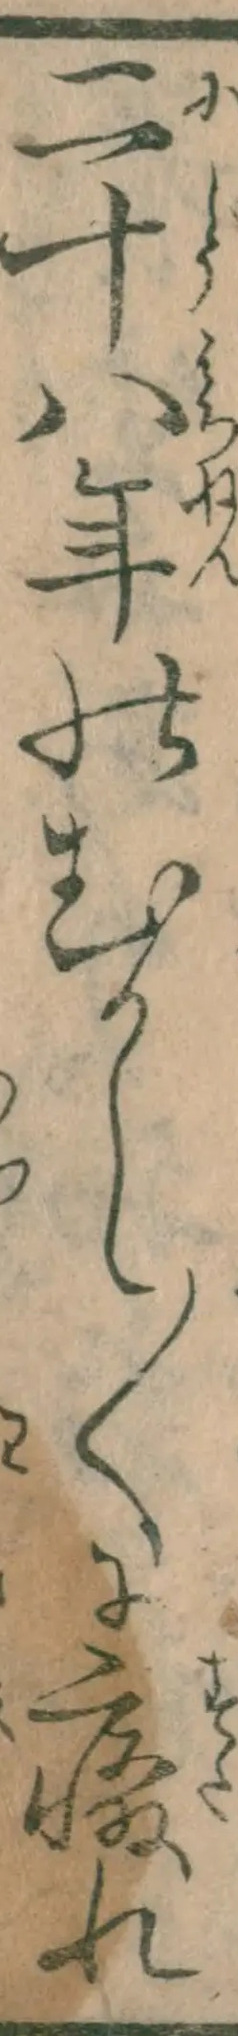二十八年のむかし〳〵に廃れ
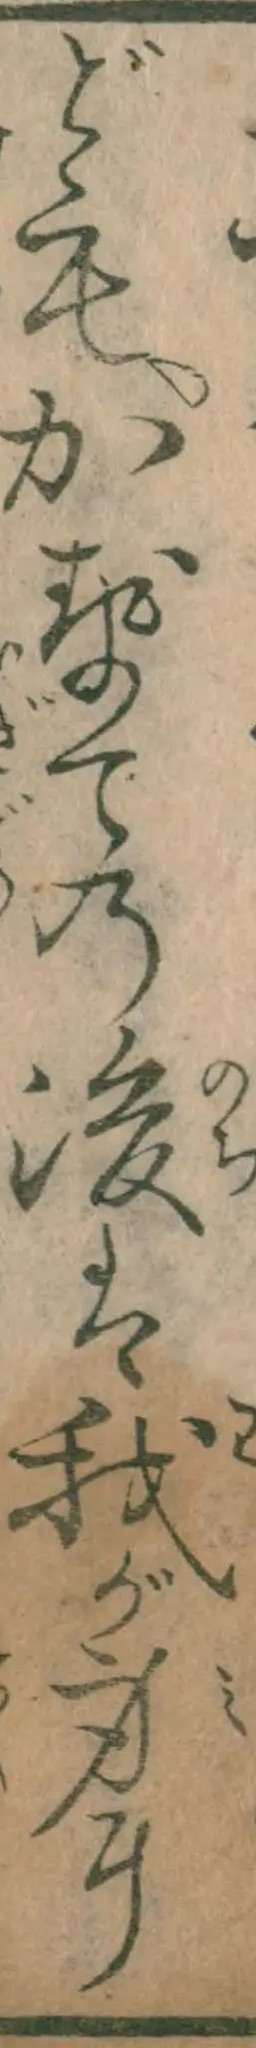ども、かせての後は我が身に
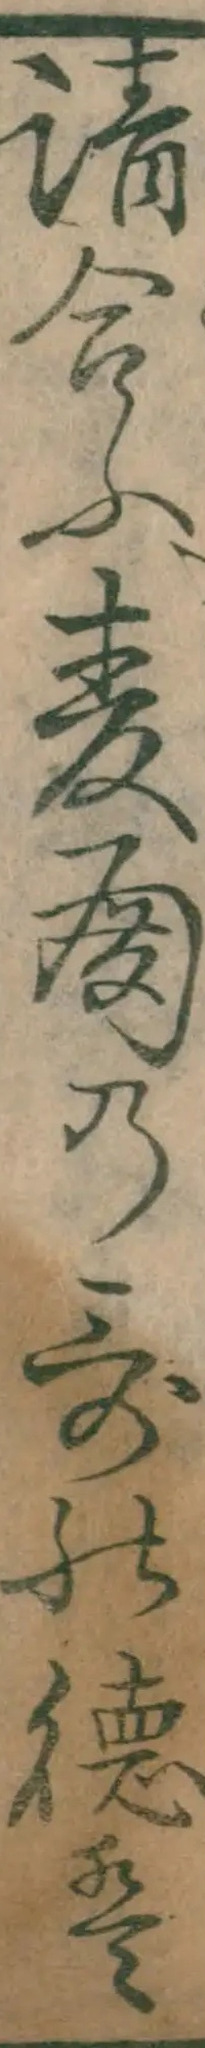請合ふ、麦殿の歌の徳は

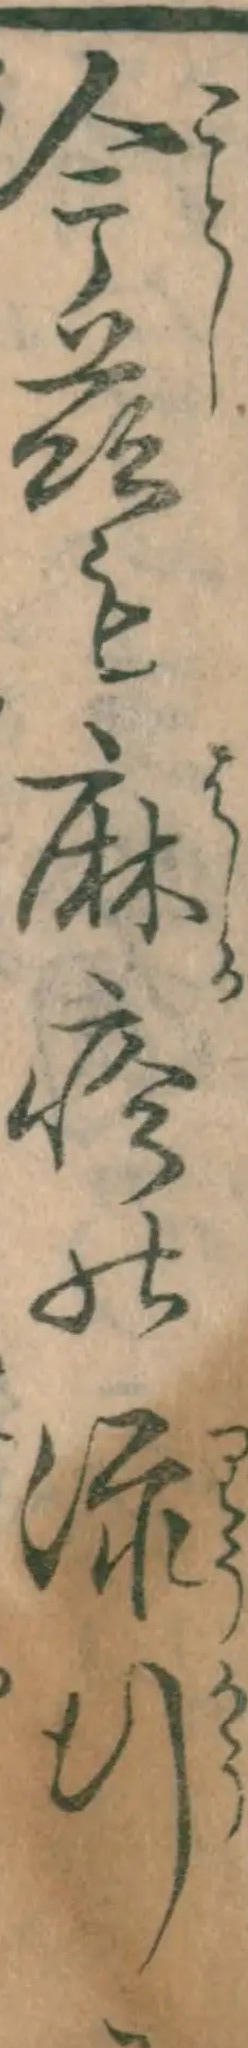今茲も麻疹の流行に
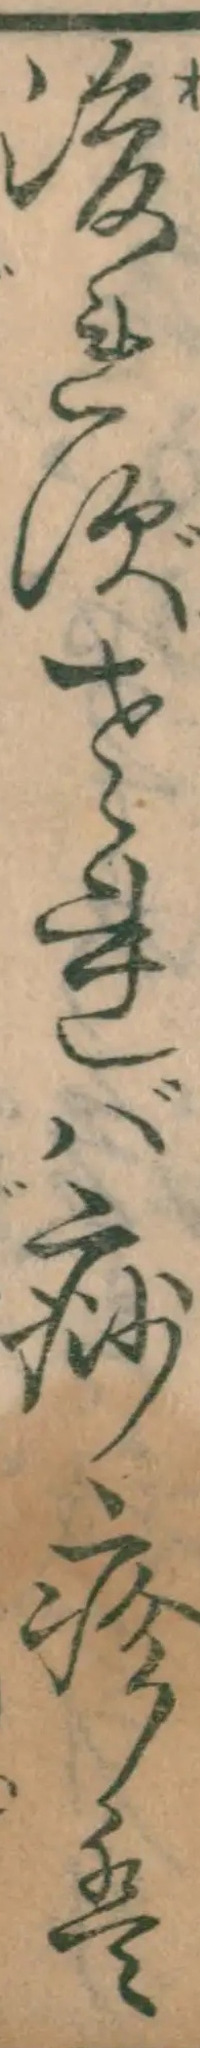後れず、されば痧疹は
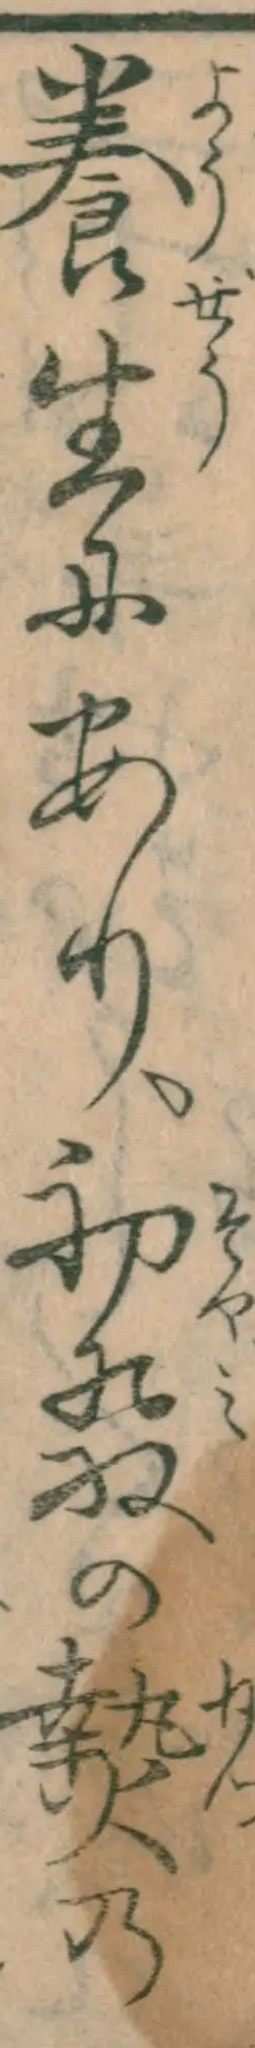養生にあり、初発の熱の
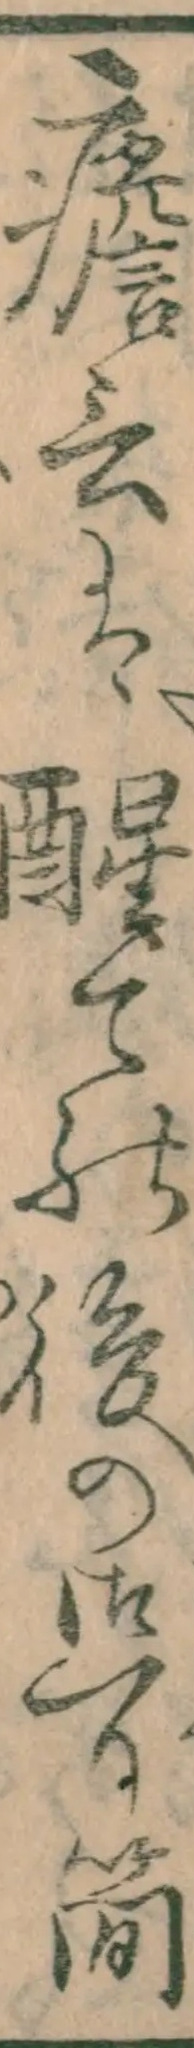癚語は、醒ての後の御了簡
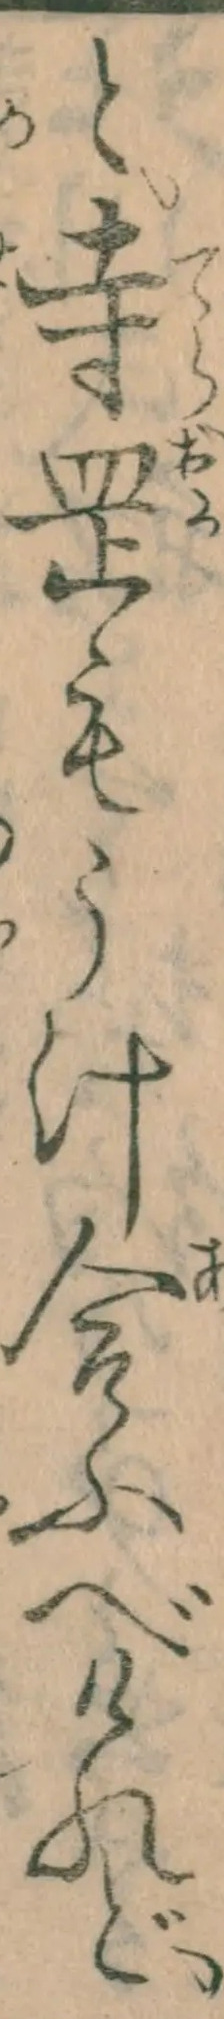と、寺岡もうけ合ふべけれど、
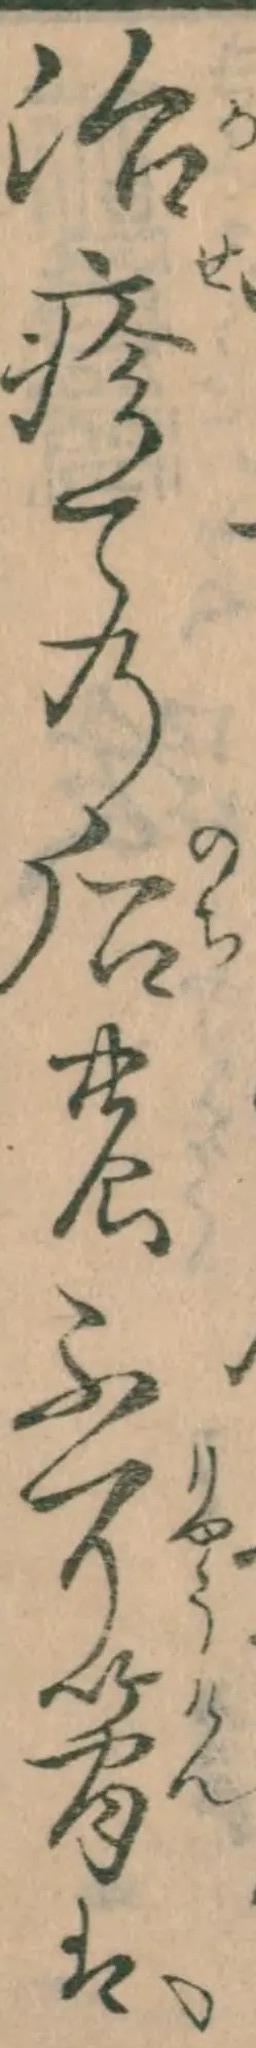治疹ての后のふ了簡は、
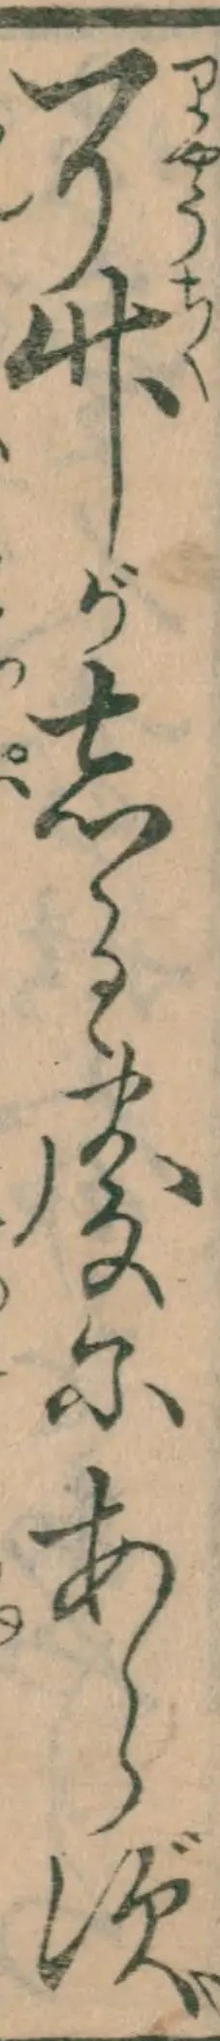了竹が忘るゝ処にあらず、
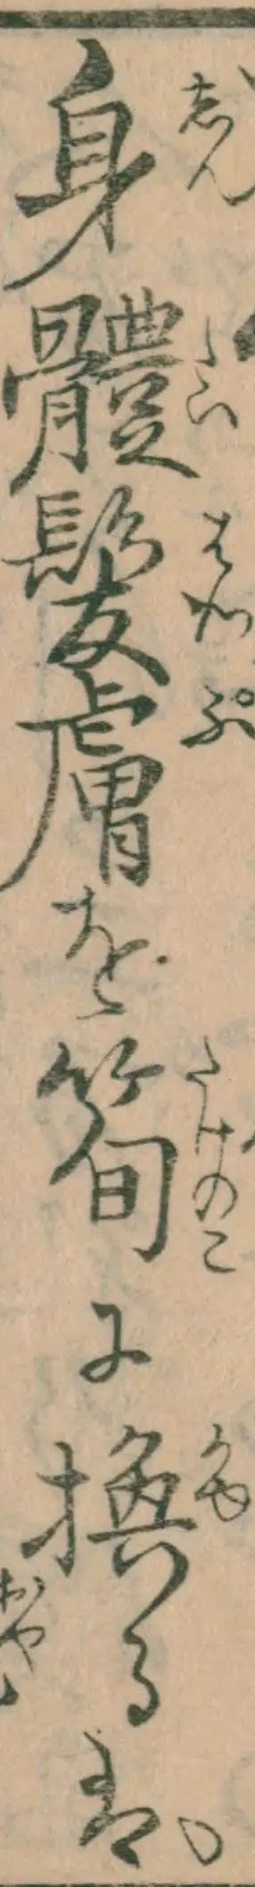身体髪膚を筍に換るは、
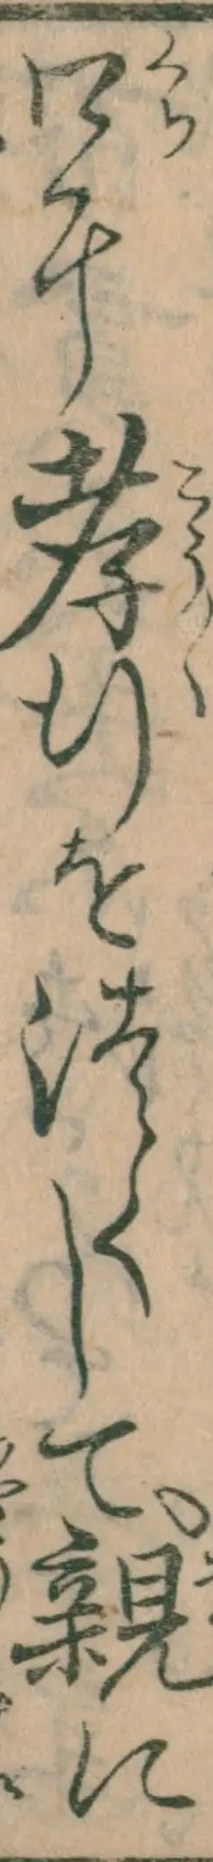口に孝行をつくして、親に
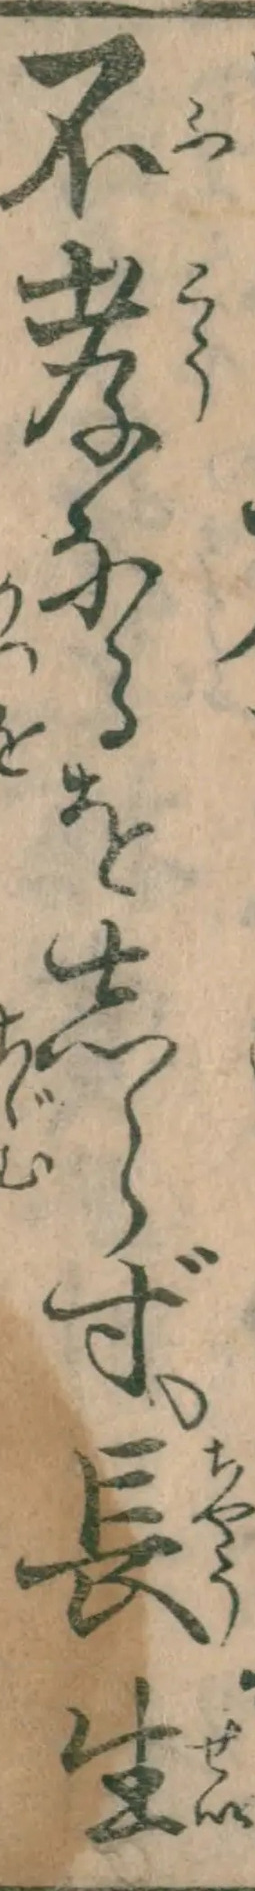不孝なるをしらず、長生
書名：麻疹戯言
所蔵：国立国会図書館 National Diet Library, JAPAN
